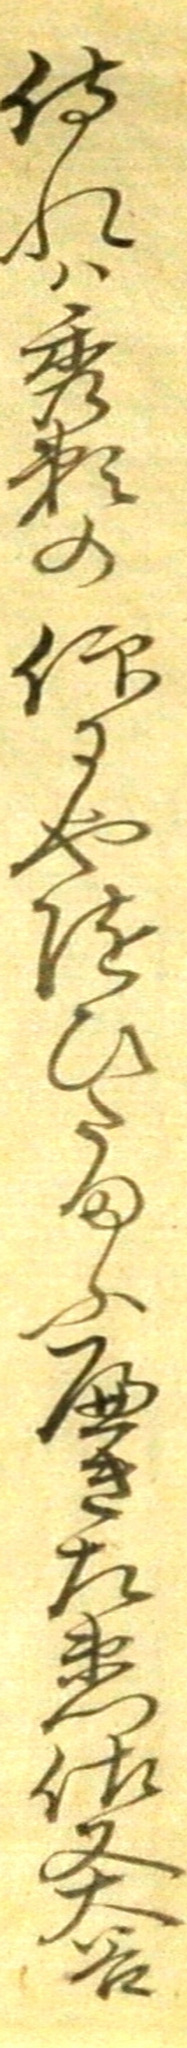侍れは秀頼の仰にや随ひたまふへき左衛門佐又大谷
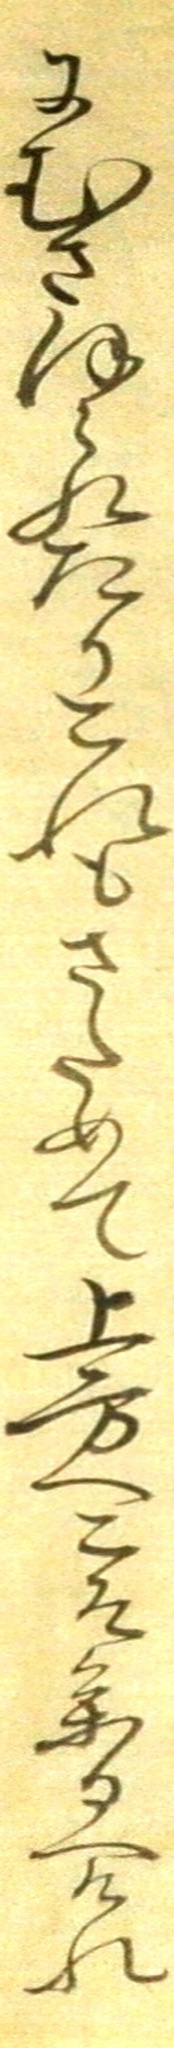にむさほられたりこれもさためて上方へこそ参るへけれ
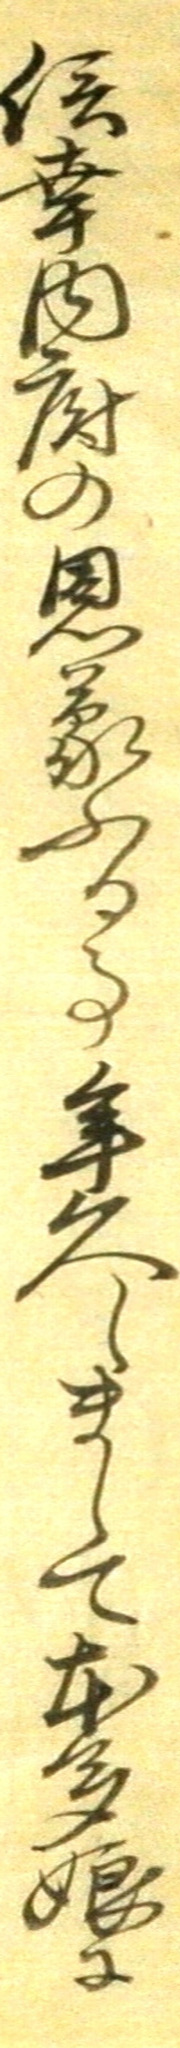信幸内府の恩蒙ふる事年久しまして本多娘に
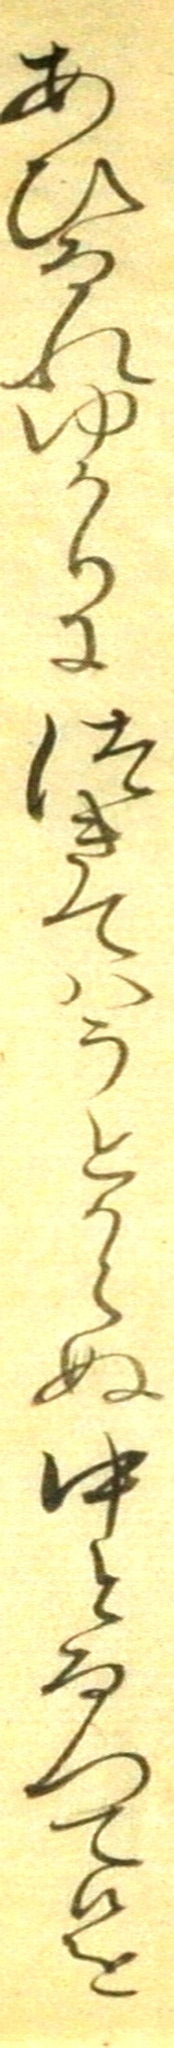あひなれゆかりにつきてはうとからぬ中となつて候を
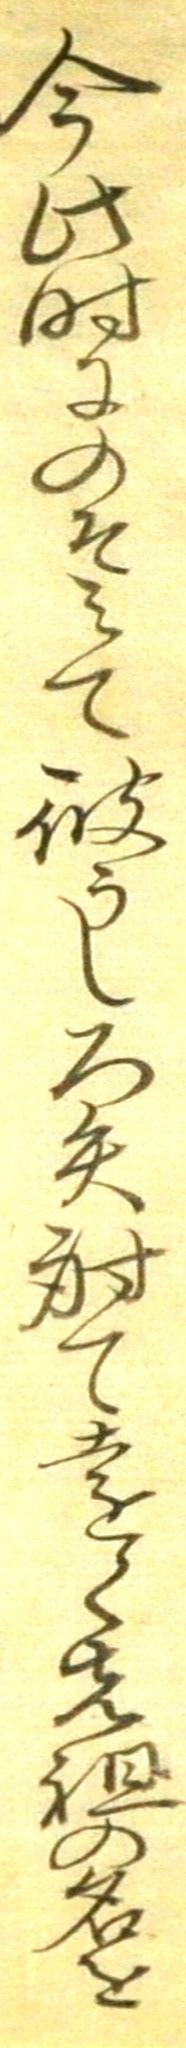今此時にのそみて彼うしろ矢射て遠く先祖の名を
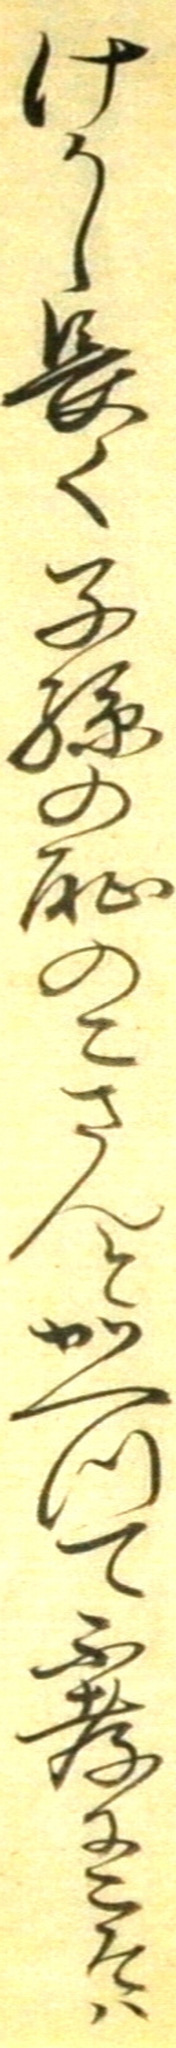けかし長く子孫の恥のこさんとかへつて不孝にこそは
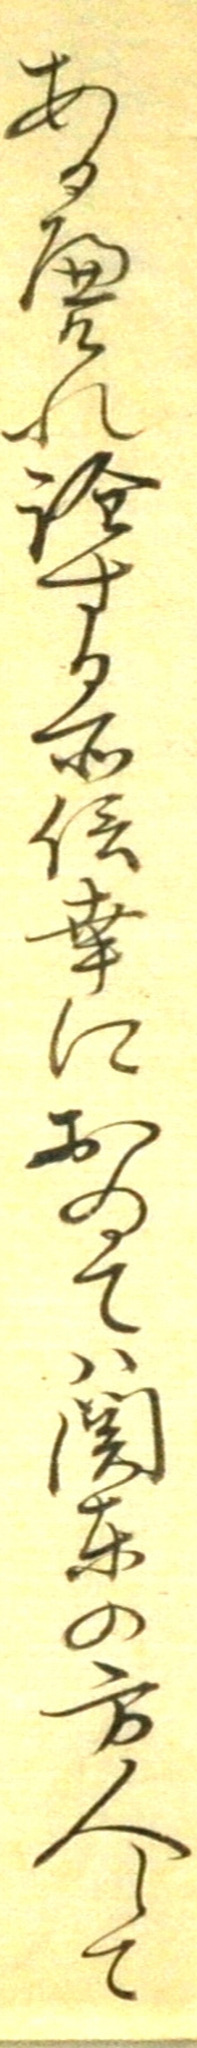あるへけれ詮する所信幸におゐては関東の方人して
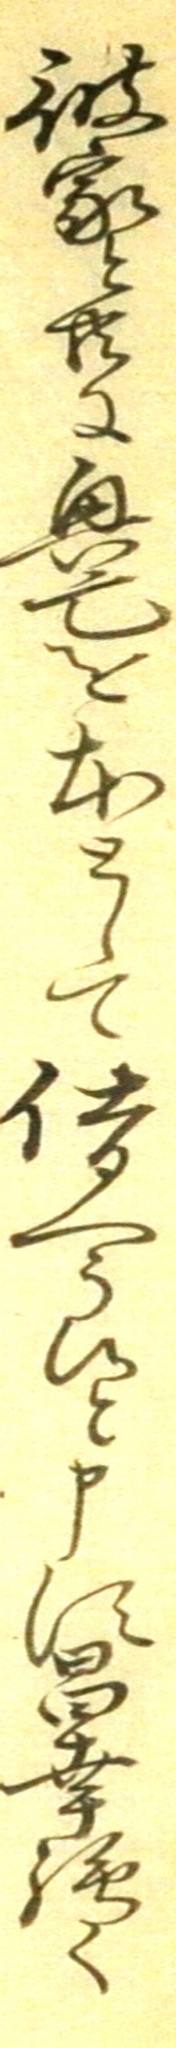彼家と共に興亡を本として仕るへう候と申す昌幸強く
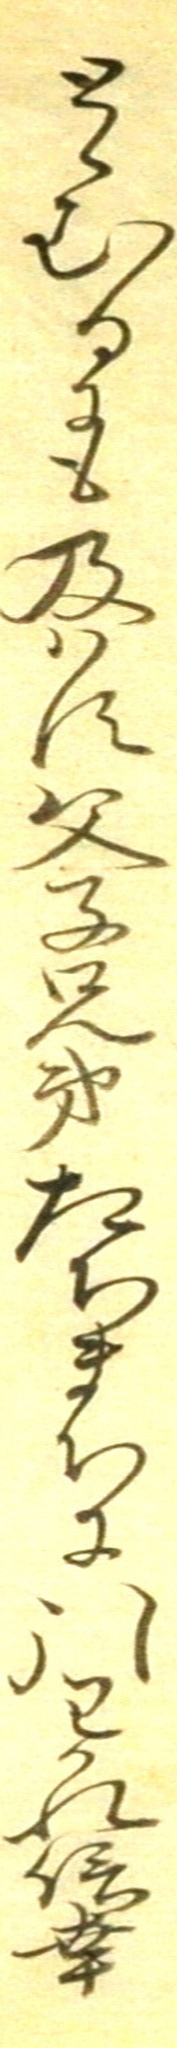とゝむるにも及はす父子兄弟たちまちに引わかれ信幸
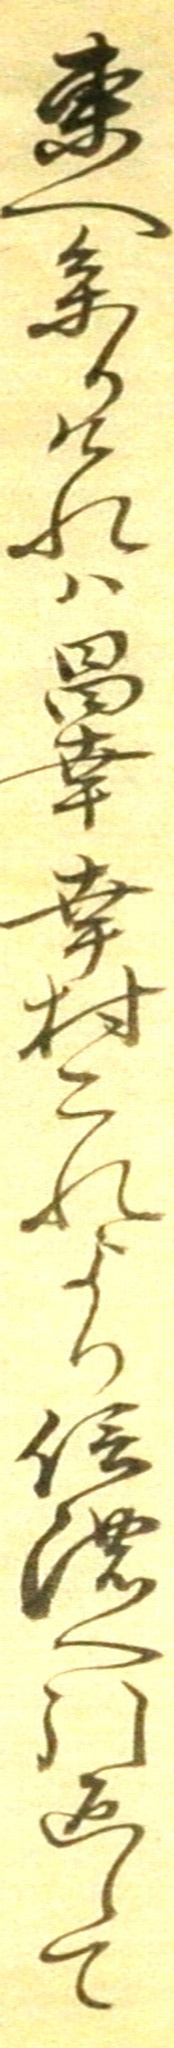東へ参りけれは昌幸幸村これより信濃へ引返して
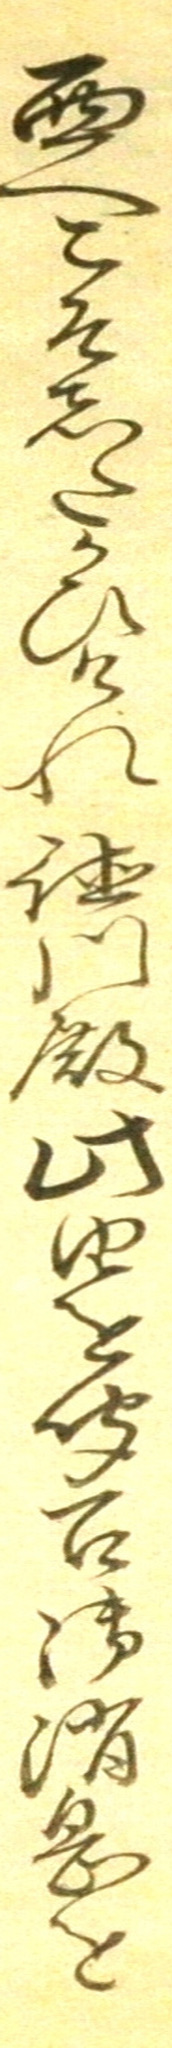西へこそしたかひけれ徳川殿此由を聞召御消息を
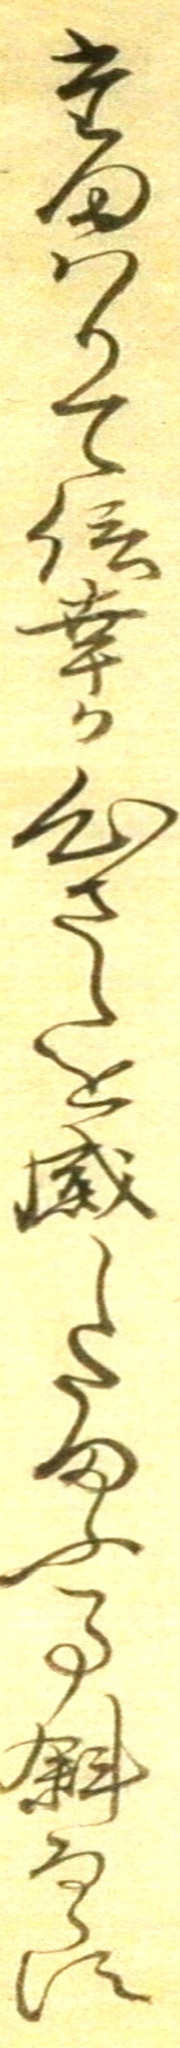たまはりて信幸か心さしを感したまふ事斜ならす
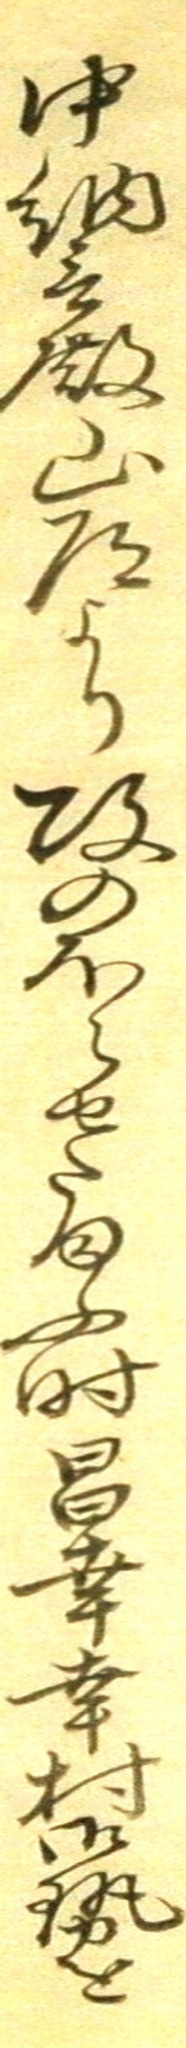中納言殿山道より攻のほらせたまふ時昌幸幸村御勢を
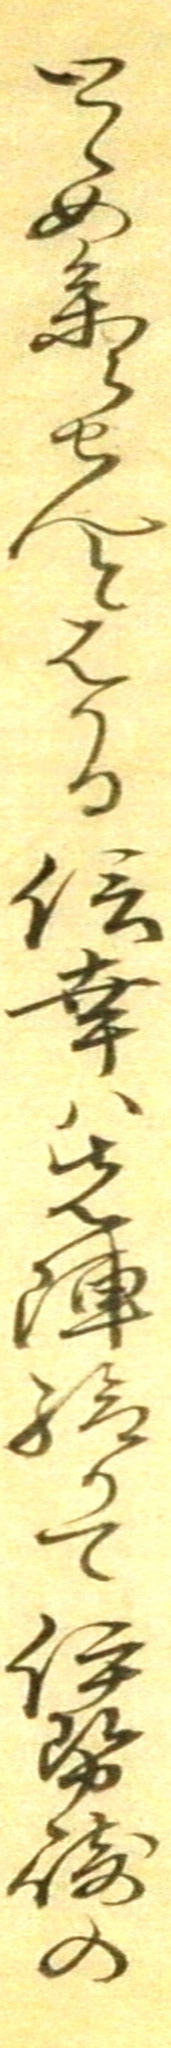とゝめ参らせんとはかる信幸は先陣給りて伊勢崎の
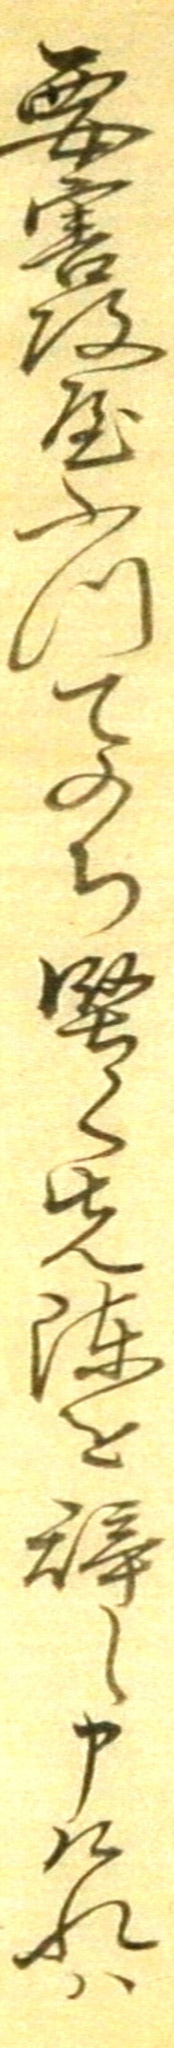要害攻やふつてのち堅く先陣を辞し申けれは
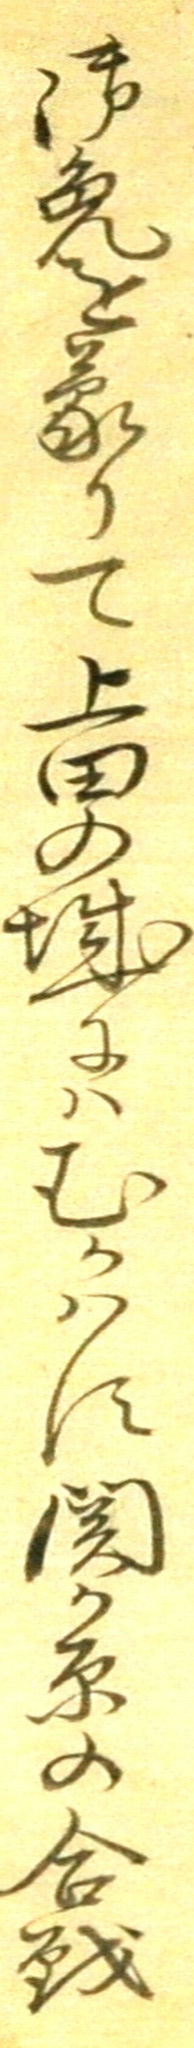御免を蒙りて上田の城にはむかはす関か原の合戦
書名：藩翰譜（九・上）
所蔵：伊那市立高遠町図書館・合同会社AMANE
